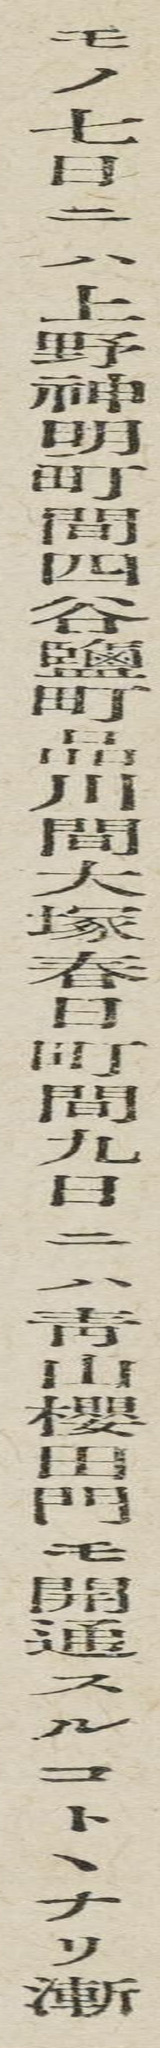モノ七日ニハ上野神明町四谷塩町品川間大塚春日町間九日ニハ青山桜田門モ開通スルコトヽナリ漸
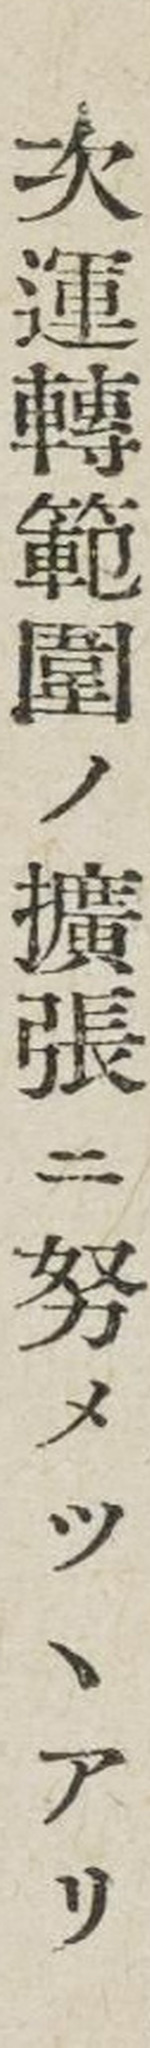次運転範囲ノ拡張ニ努メツヽアリ
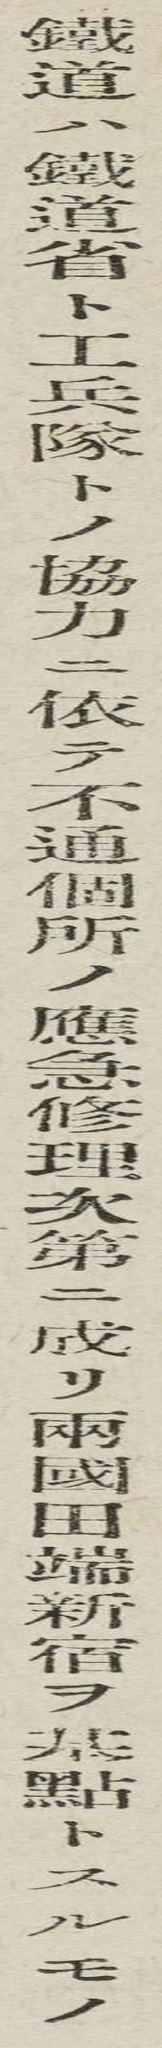鉄道ハ鉄道省ト工兵隊トノ協力ニ依テ不通箇所ノ応急修理次第ニ成リ両国田端新宿ヲ基点トスルモノ
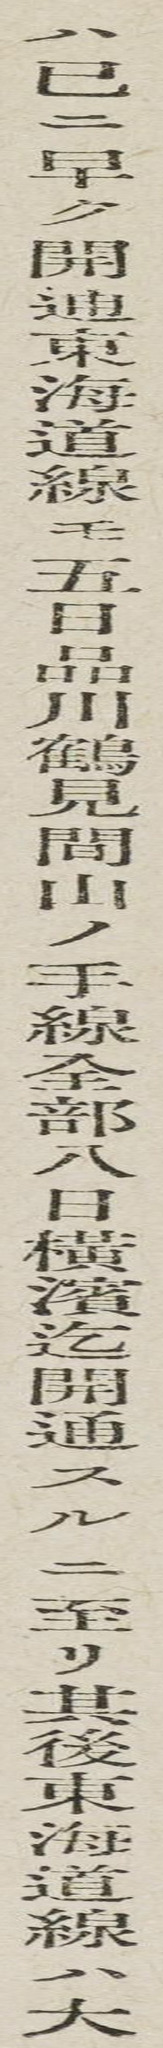ハ已ニ早ク開通東海道線モ五日品川鶴見間山ノ手線全部八日横浜迄開通スルニ至リ其後東海道線ハ大
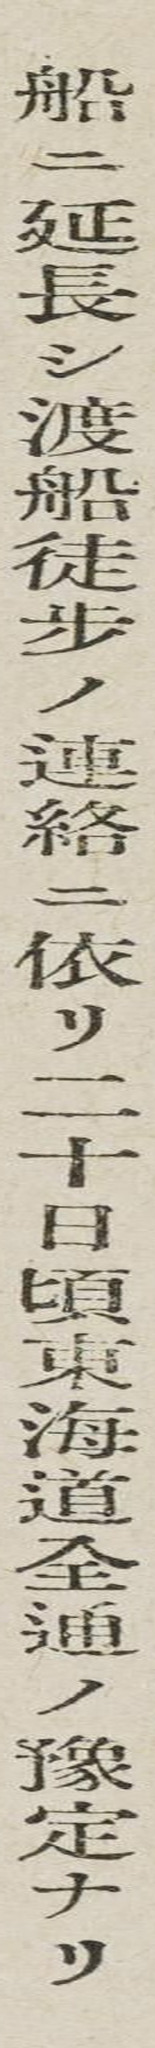船ニ延長シ渡船徒歩ノ連絡ニ依リ二十日頃東海道全通ノ予定ナリ
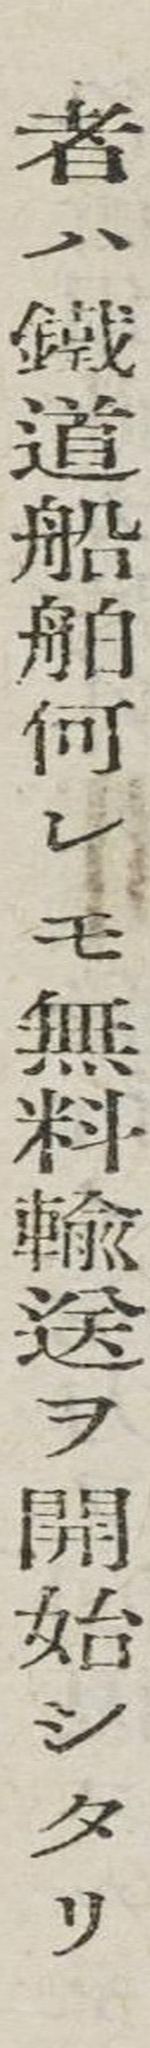者ハ鉄道船舶何レモ無料輸送ヲ開始シタリ
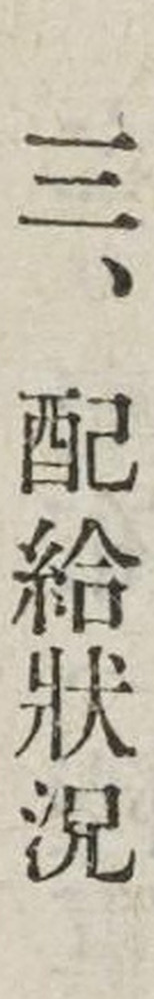三、配給情況
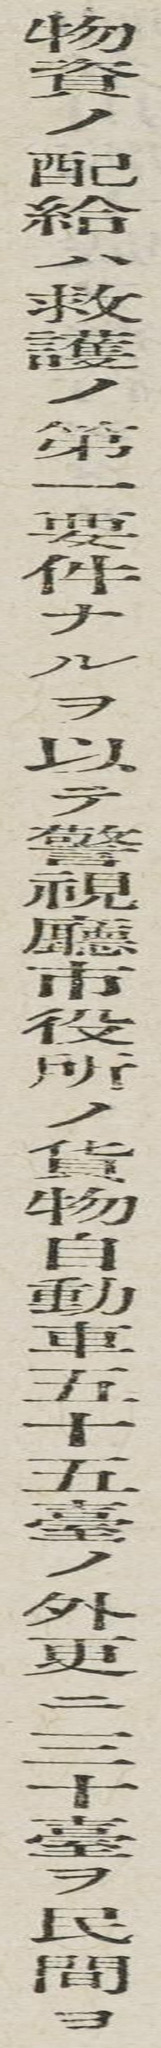物資ノ配給ハ救護ノ第一要件ナルヲ以テ警視庁市役所ノ貨物自動車五十五台ノ外更ニ三十台ヲ民間ヨ
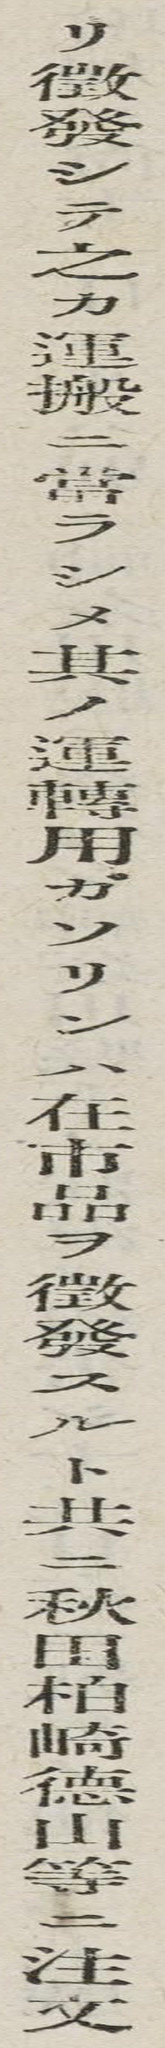リ徴発シテ之カ運搬ニ当ラシメ其ノ運転用ガソリンハ在市品ヲ徴発スルト共ニ秋田柏崎徳山等ニ注文
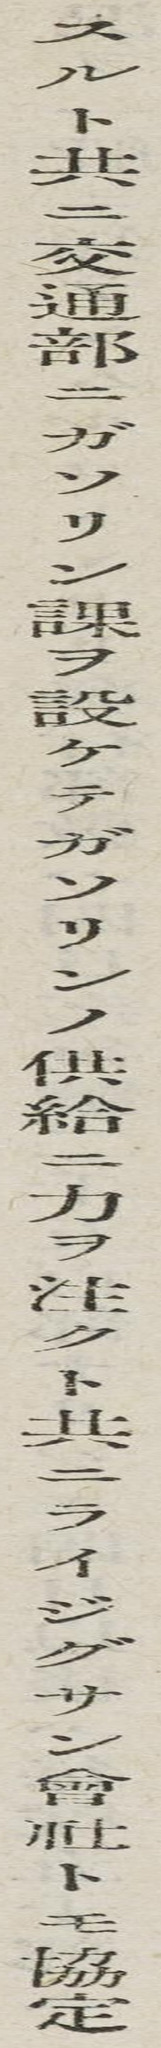スルト共ニ交通部ニガソリン課ヲ設ケテガソリンノ供給ニ力ヲ注クト共ニライジグサン会社トモ協定
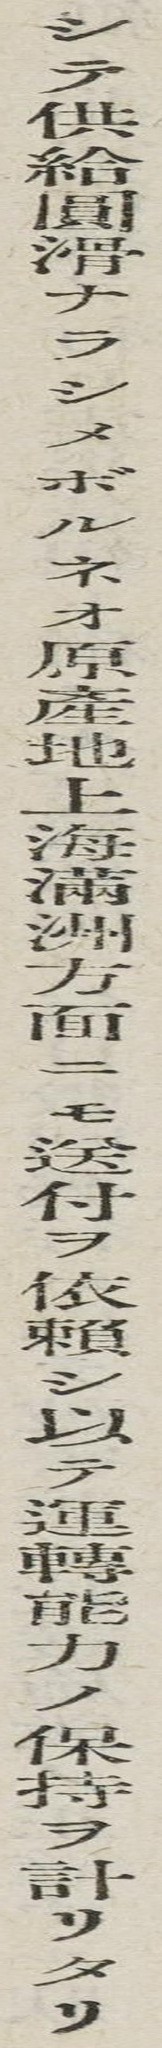シテ供給円滑ナラシメボルネオ原産地上海満州方面ニモ送付ヲ依頼シ以テ運転能力ノ保持ヲ計リタリ
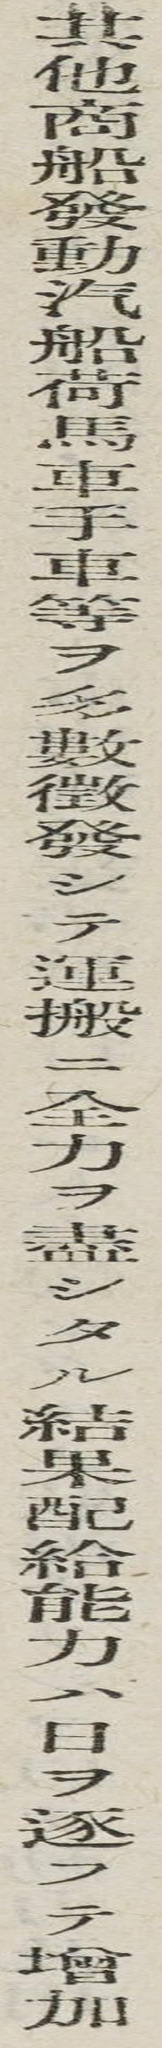其他商船発動機船荷馬車手車等ヲ多数徴発シテ運搬ニ全力ヲ尽シタル結果配給能力ハ日ヲ遂フテ増加
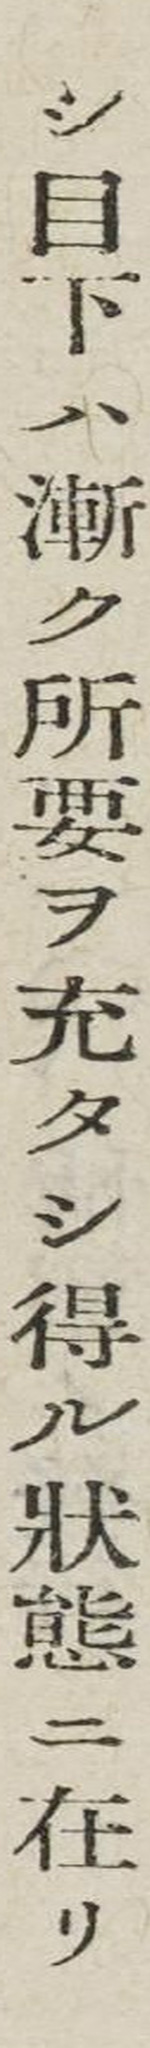シ目下ハ漸ク所要ヲ充タシ得ル状態ニ在リ
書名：震災被害状況並救護施設概要
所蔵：東京大学地震研究所図書室 Earthquake Research Institute Library, The University of Tokyo, JAPAN
